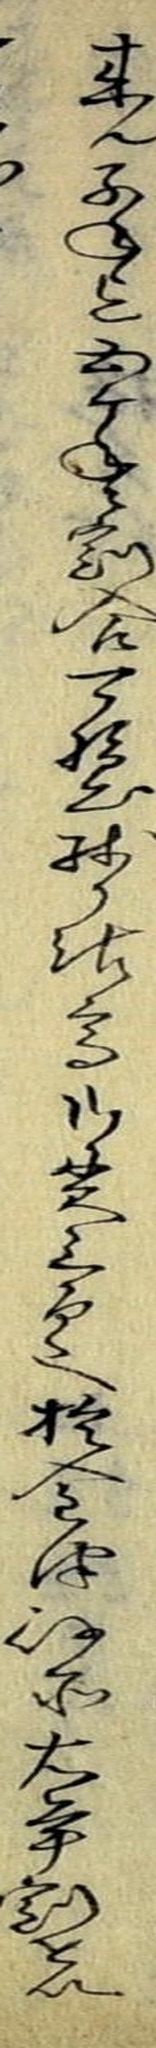来ル子年迄五ヶ年に割合可指出残り銀高弐貫三百匁於金津役所右年割を以
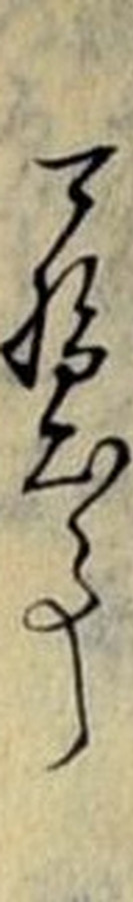可指出事
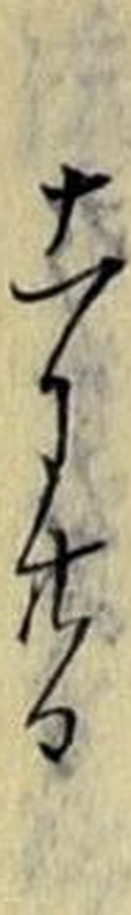十月廿三日
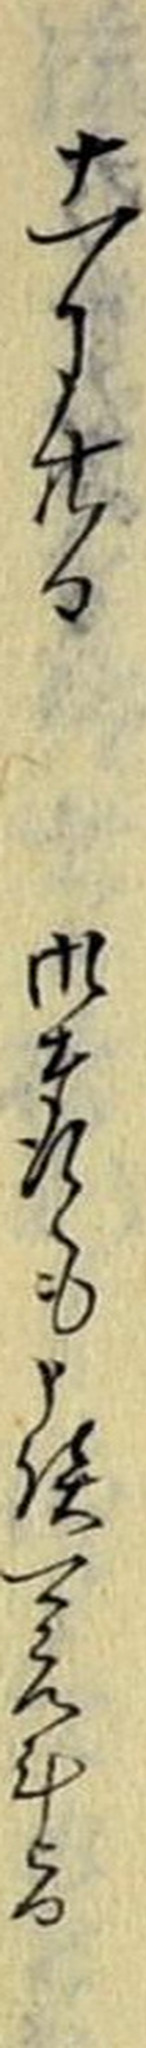十一月廿日御奉行へも申談可取斗旨
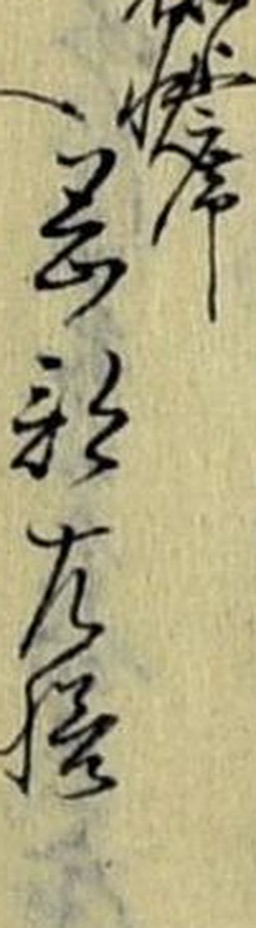岡部左膳
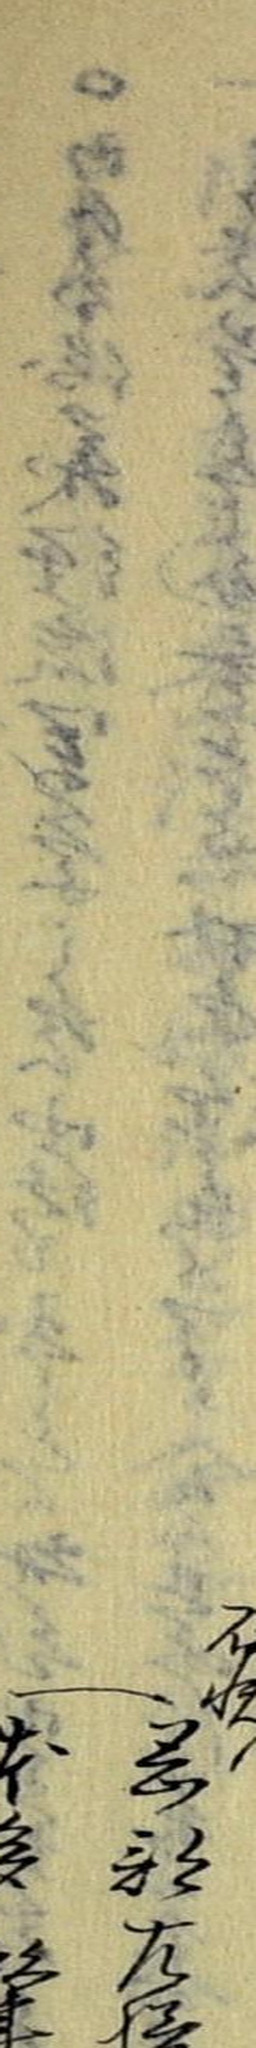本多肇
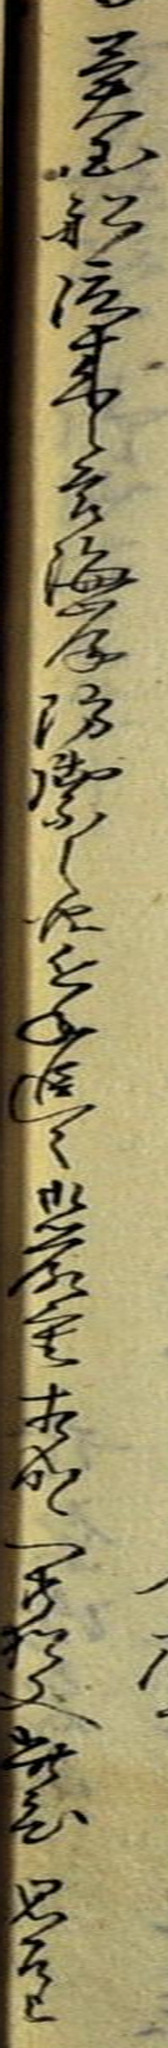○異国船渡来之節海岸防禦近年追々御厳重相成候へ共猶又此度思召被
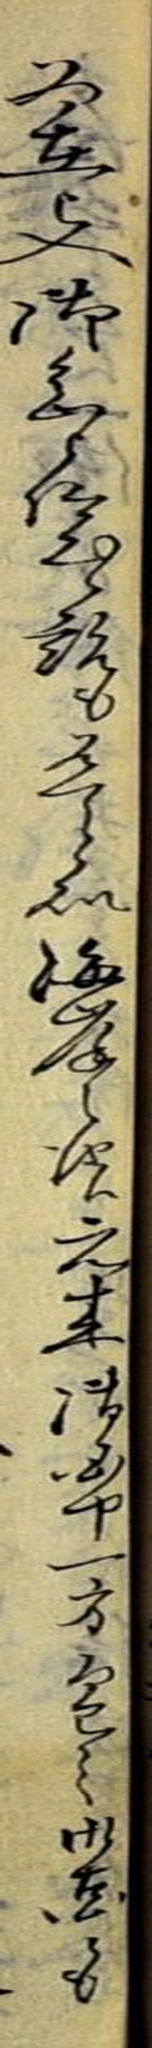為在被入御念被仰出候趣も有之候処海岸之儀は元来御国中一方而己之御固にも
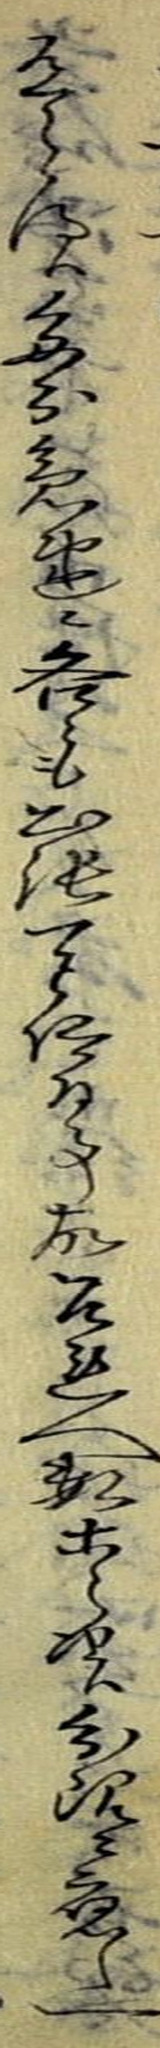有之候得は多分急速に各にも出張可被仰付事故召連人数等之儀は分限に応し一
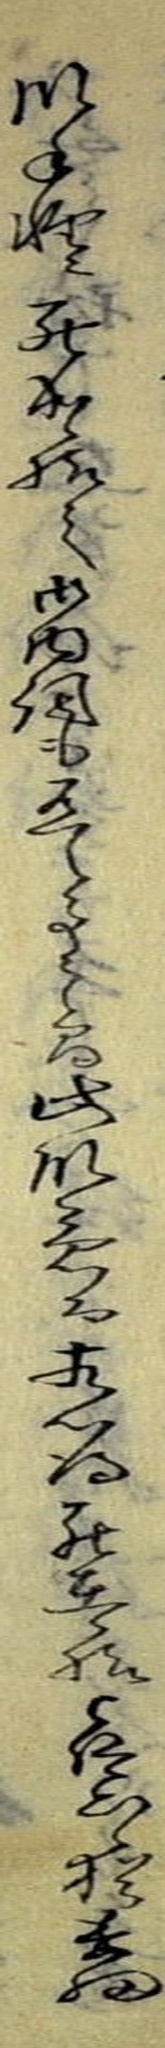段手軽に罷成候様之御内調も有之事に候間此段兼而相心得罷在候様被仰出候猶委細
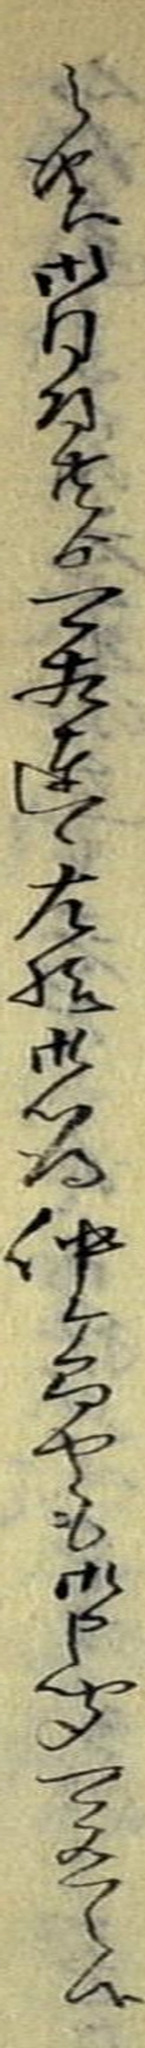之儀は御目付共ゟ可相達候左様相心得仲ヶ間中へも御申聞可有之候
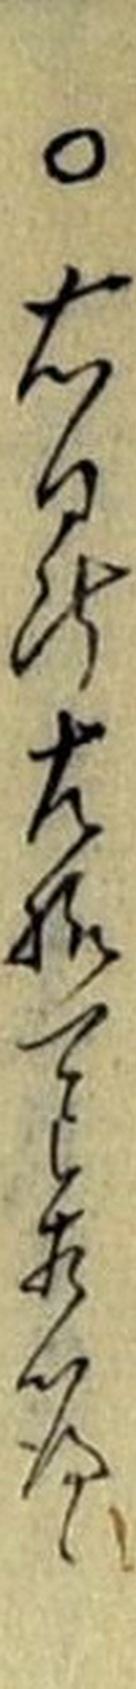○右同断左様可被相心得候
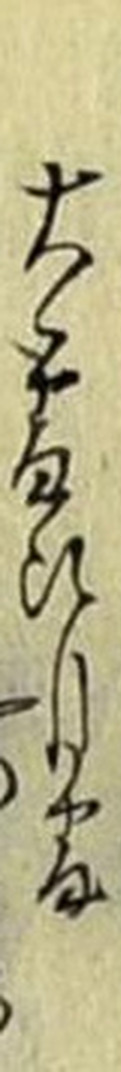大御番頭月番
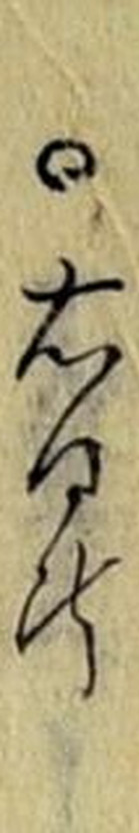○右同断
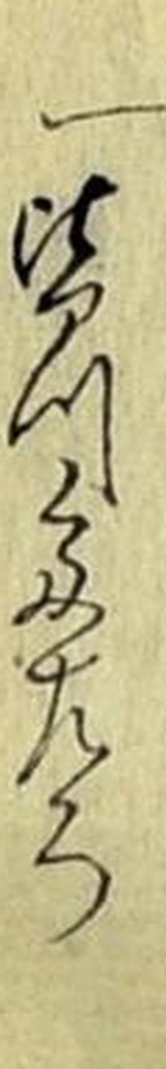皆川多左衛門
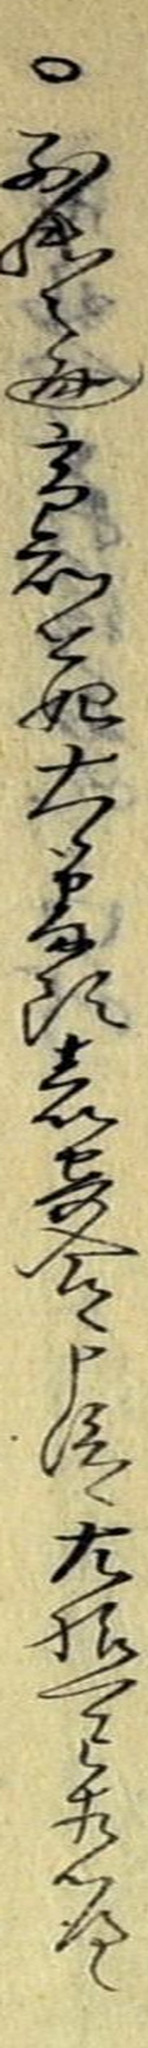○別紙之通高知を始大御番頭表寄合へ申渡候左様可被相心得候
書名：命令之部 六
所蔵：福井県文書館 Fukui Prefectural Archives
